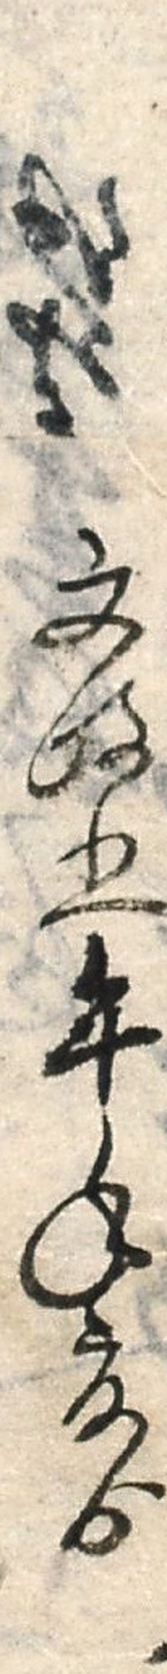文政五午年夏ゟ
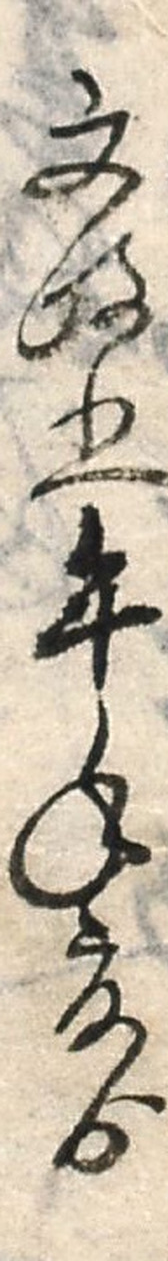文政五午年夏ゟ
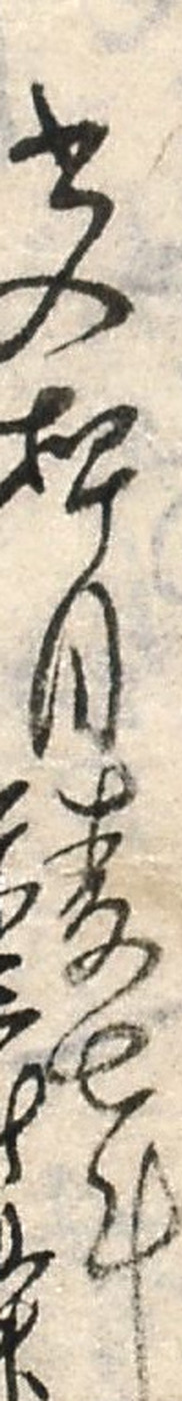書入押目麦七斗
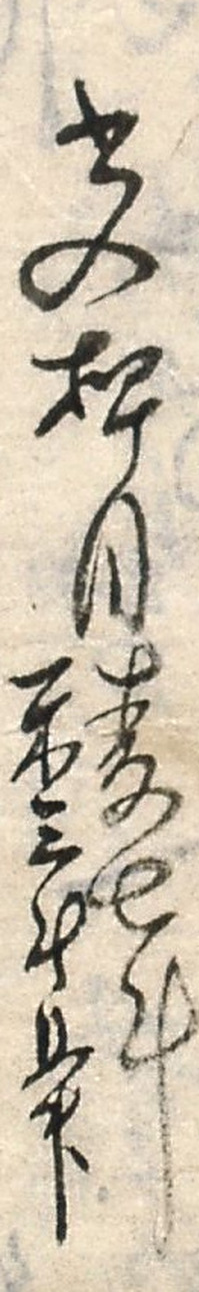書入押目麦七斗
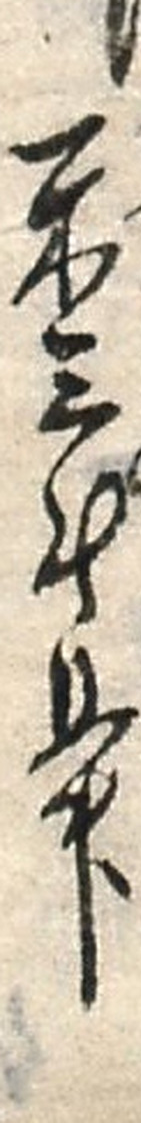米三斗五升
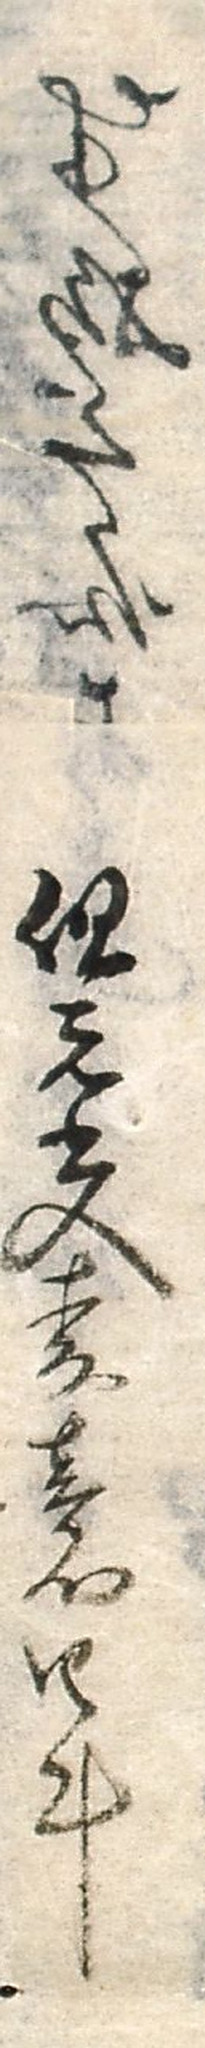但元書入麦壱石四斗
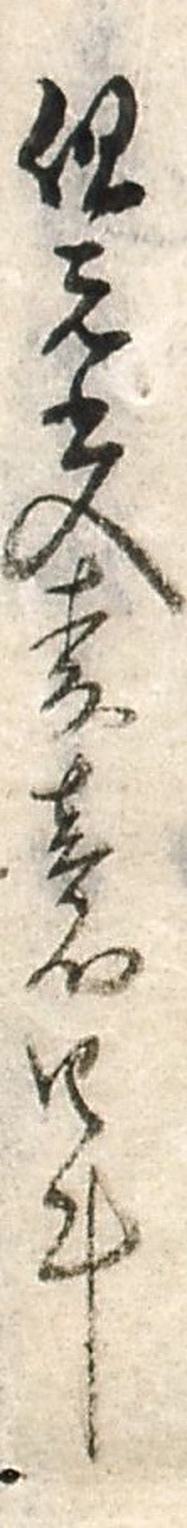但元書入麦壱石四斗
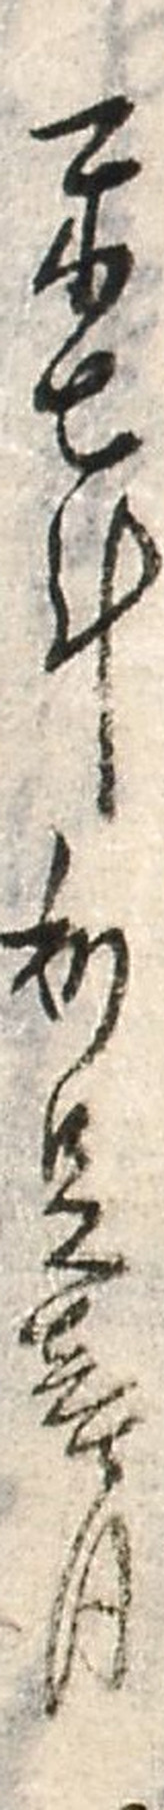米七斗利足壱ヶ月
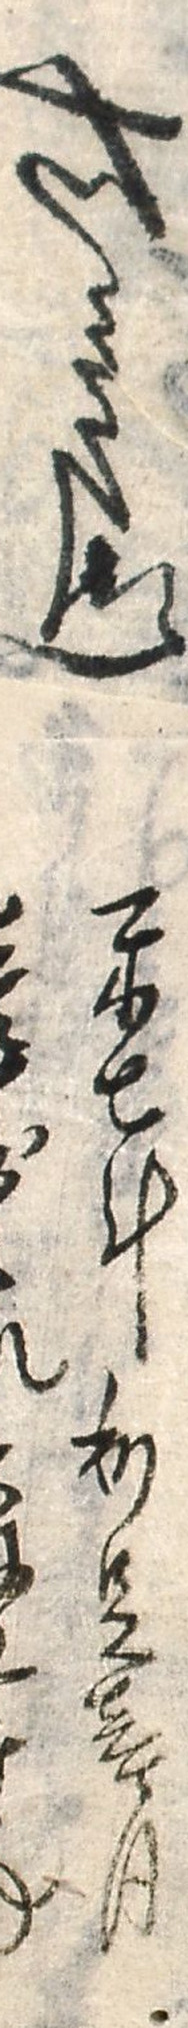米七斗利足壱ヶ月
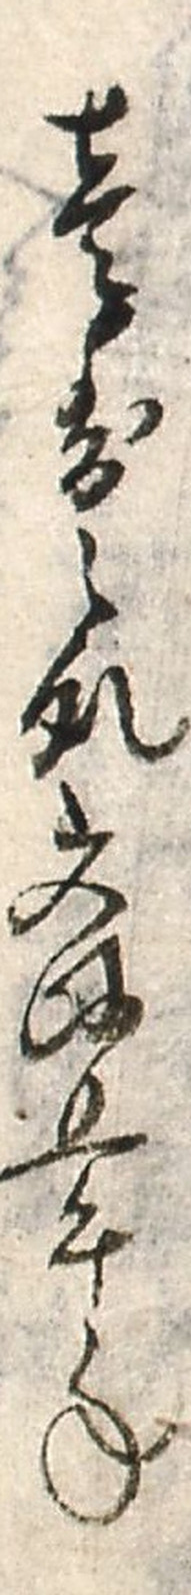壱歩之処文政五午年
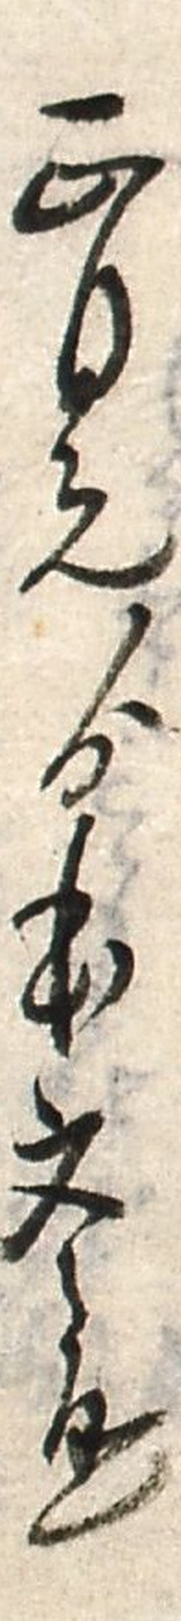正月元ゟ本文之通
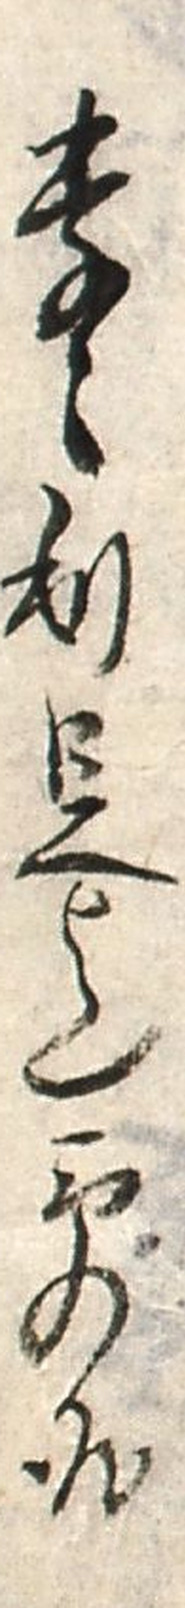季々利足迄受取
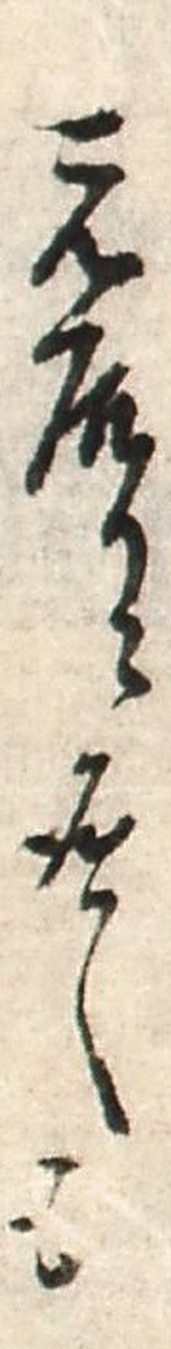元居りに御座候以上

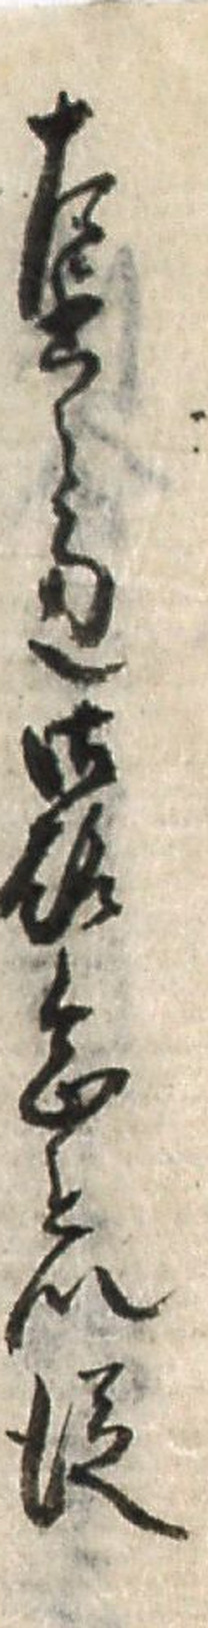左書之通御趣意を以従
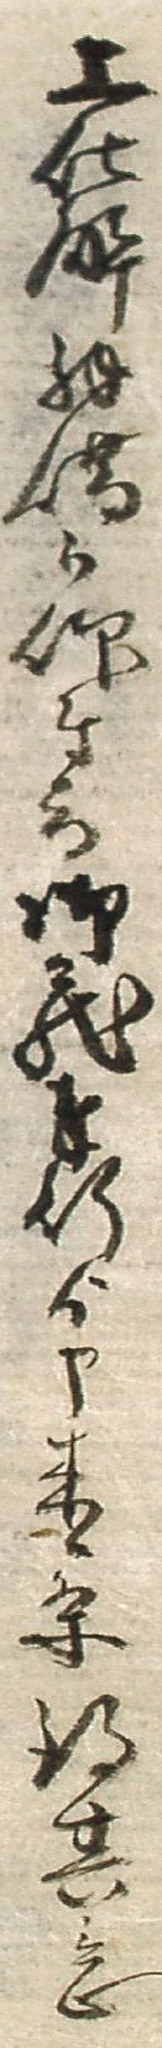上仕解拝借被仰付旨御蔵奉行ゟ申来候条得其意
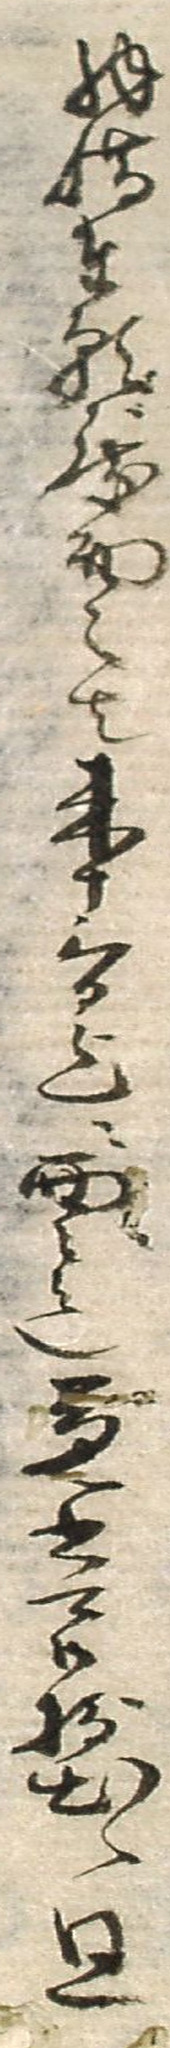拝借奉願度面々は来十三日迄に面々迄覚書可被指出候且
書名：御家中并無格御奉公人借銀御仕解一件御書付写其余共控
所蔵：鳴門教育大学 Naruto University of Education
